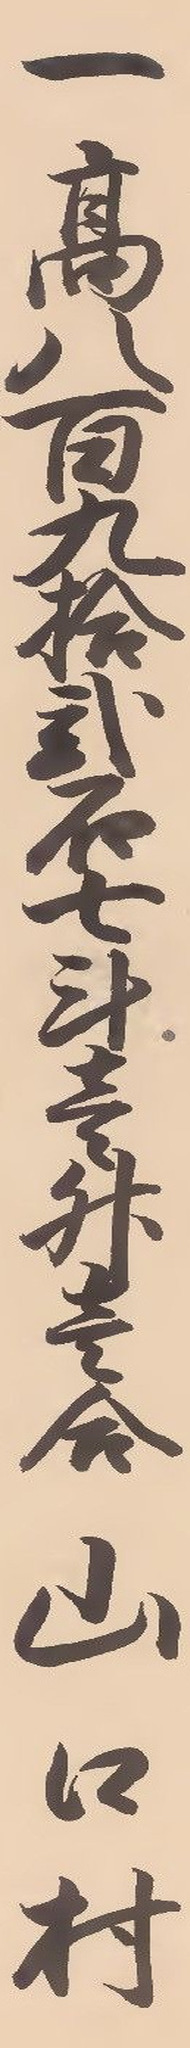一髙八百九拾弐石七斗壱升壱合山口村
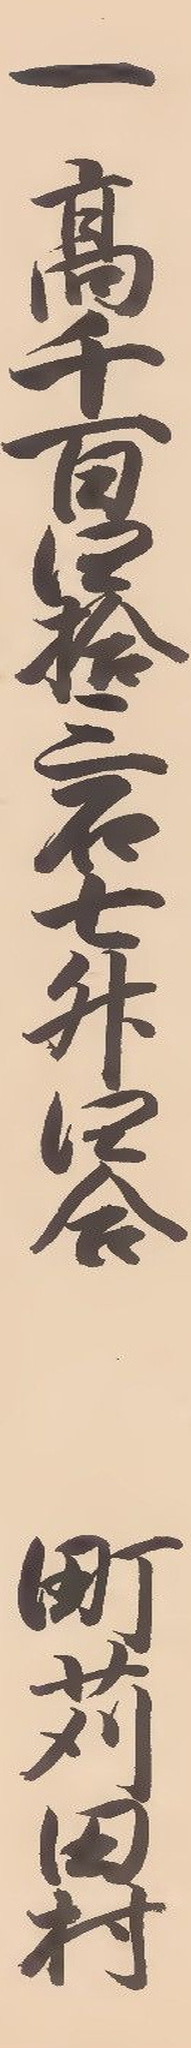一髙千百四拾三石七升四合町苅田村
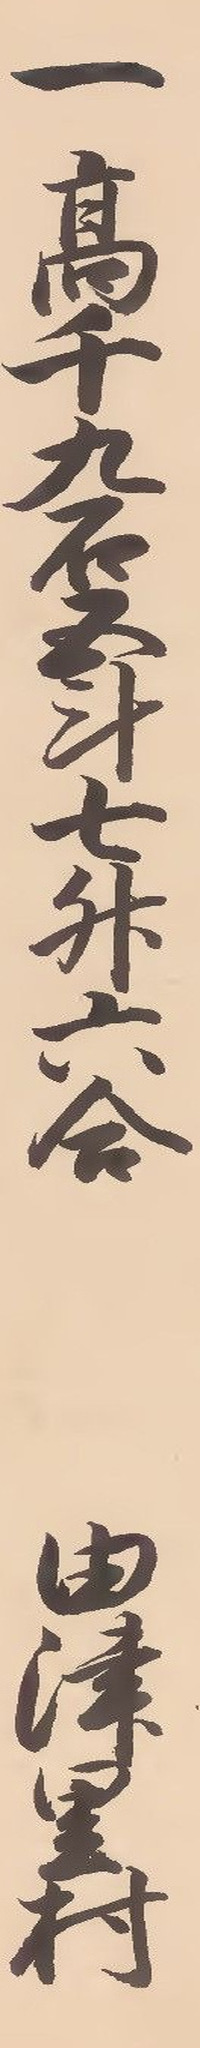一髙千九石五斗七升六合由津里村
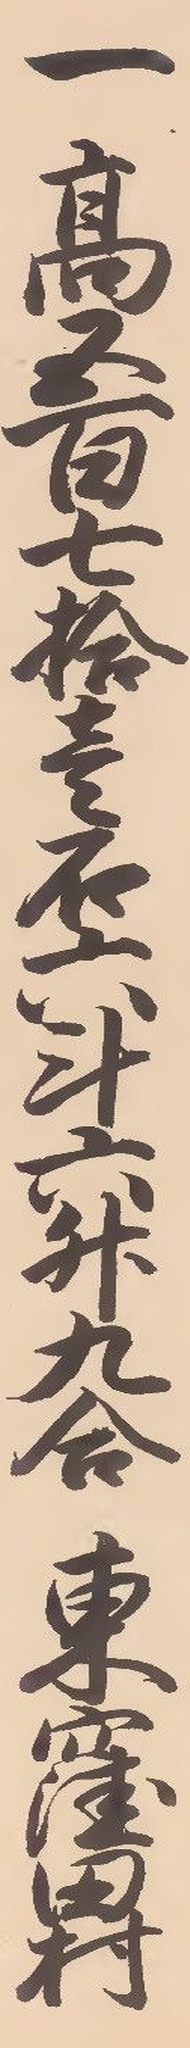一髙五百七拾壱石六斗六升九合東窪田村
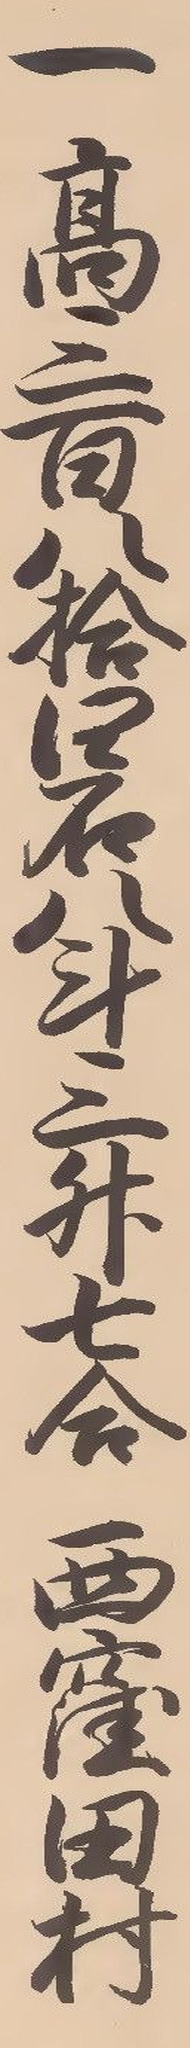一髙三百八拾四石八斗三升七合西窪田村
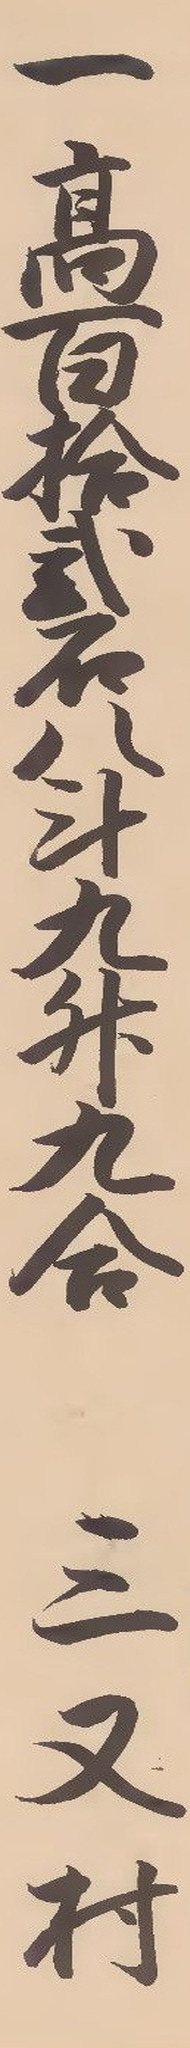一髙百拾弐石八斗九升九合三又村
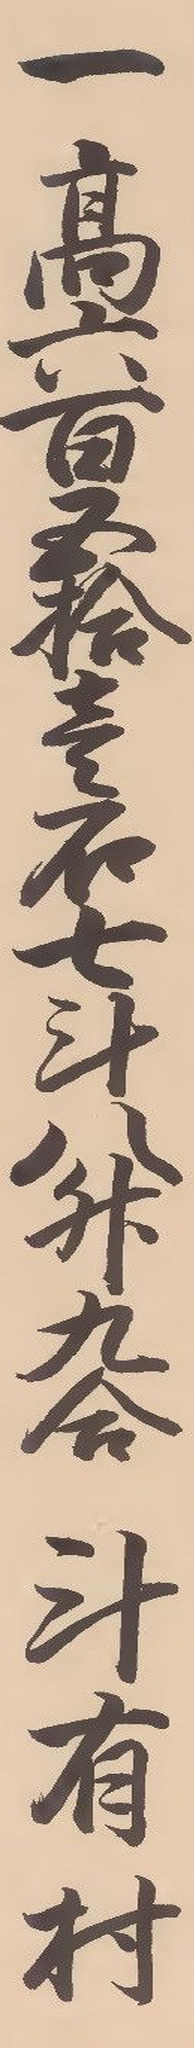一髙六百五拾壱石七斗八升九合斗有村
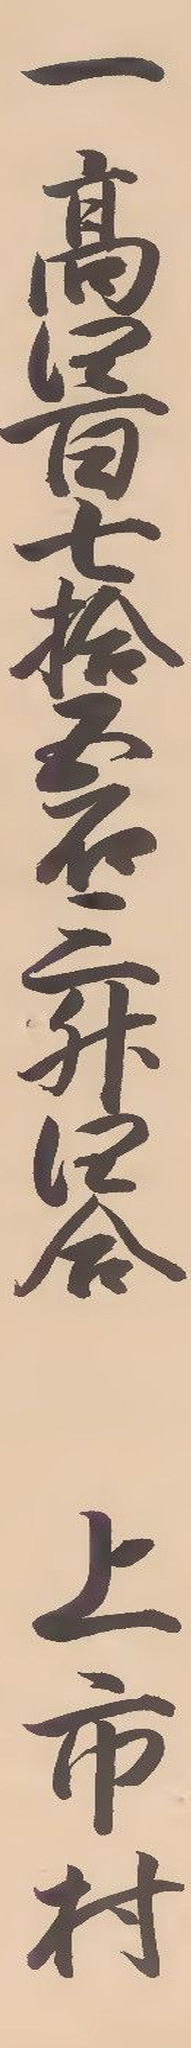一髙四百七拾五石三升四合上市村

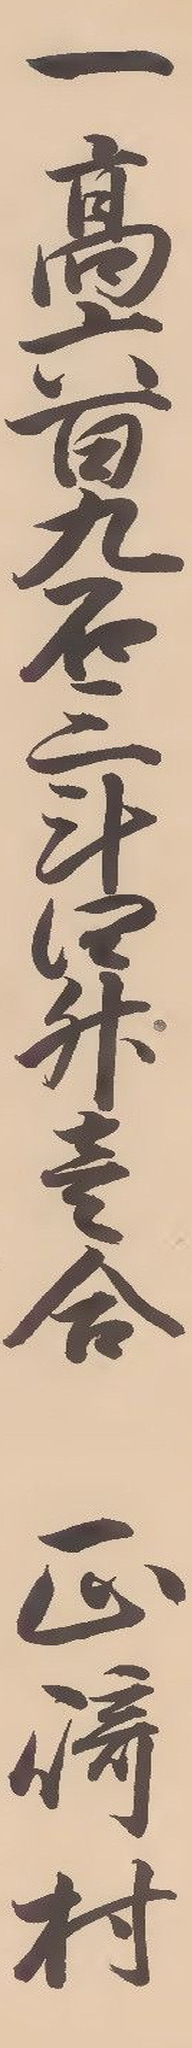一髙六百九石三斗四升壱合正崎村
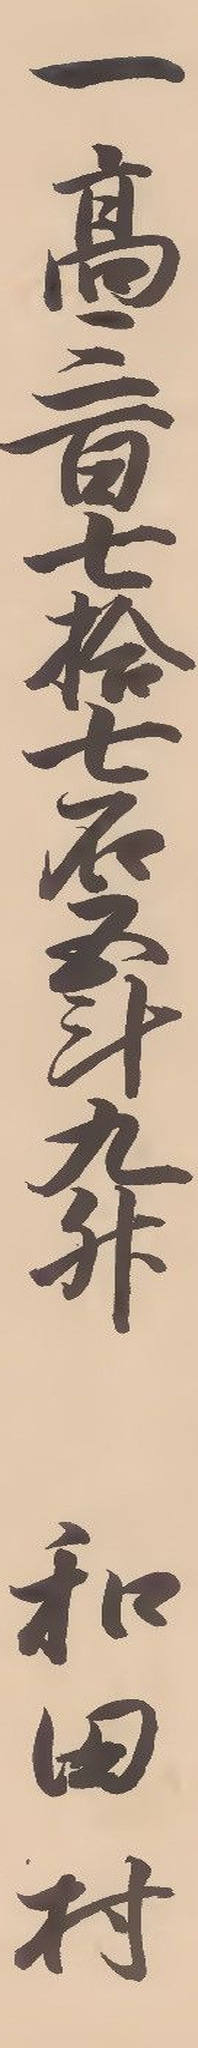一髙三百七拾七石五斗九升和田村
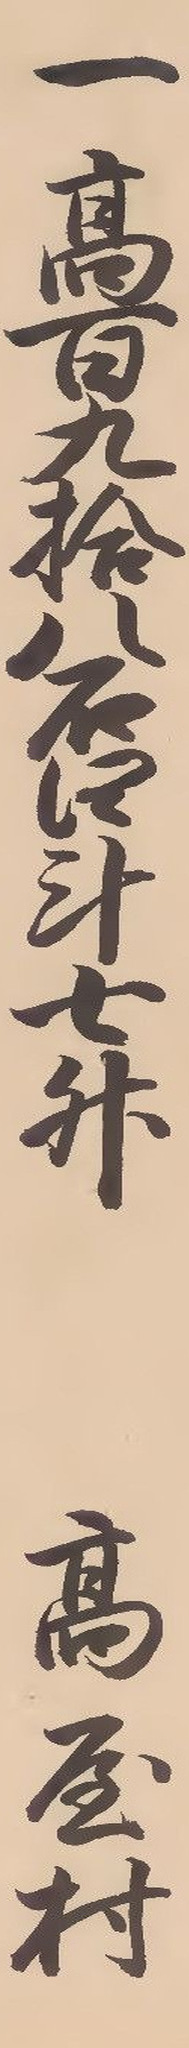一髙百九拾八石四斗七升髙屋村
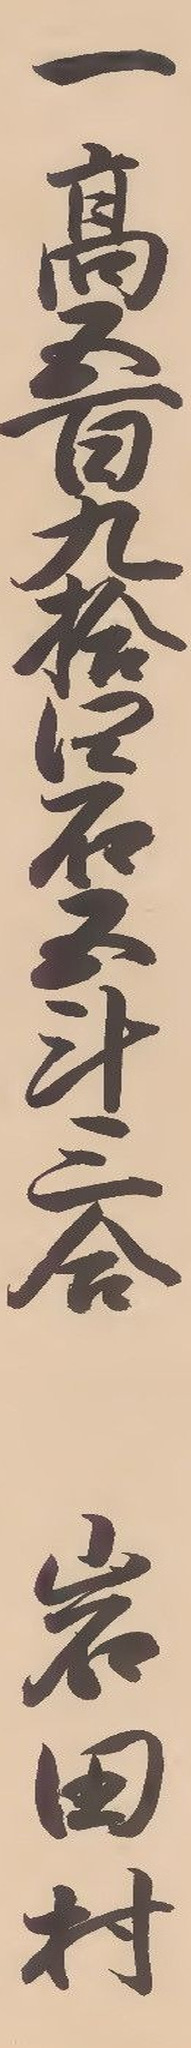一髙五百九拾四石五斗三合岩田村
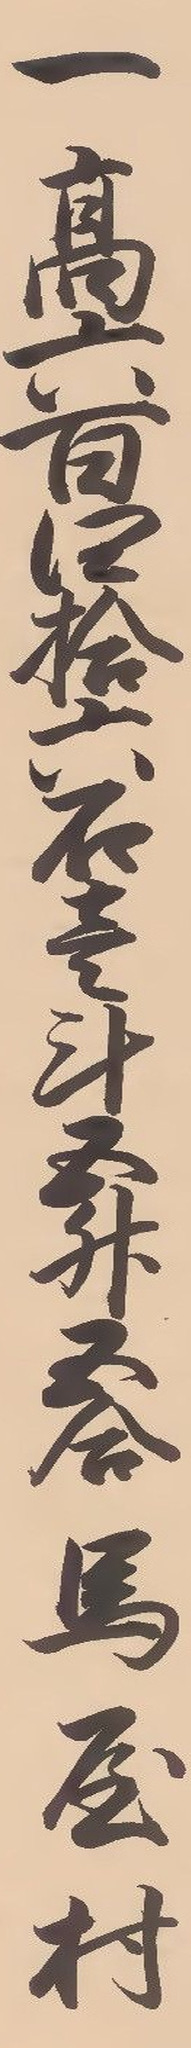一髙六百四拾六石壱斗五升五合馬屋村
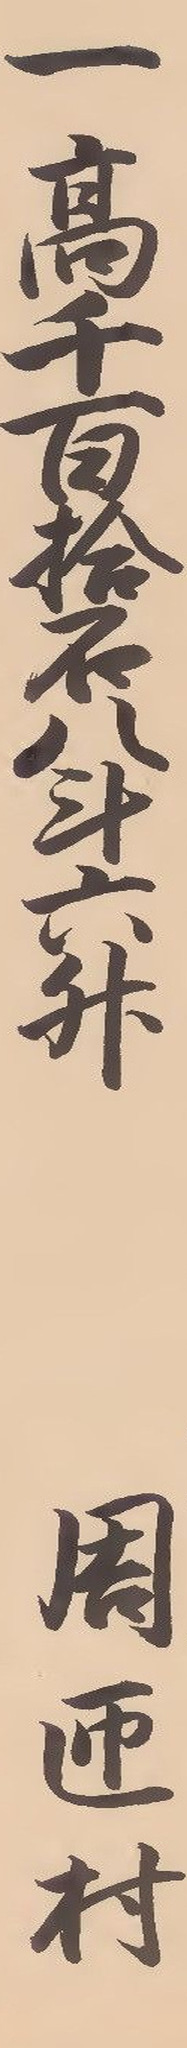一髙千百拾石八斗六升周匝村
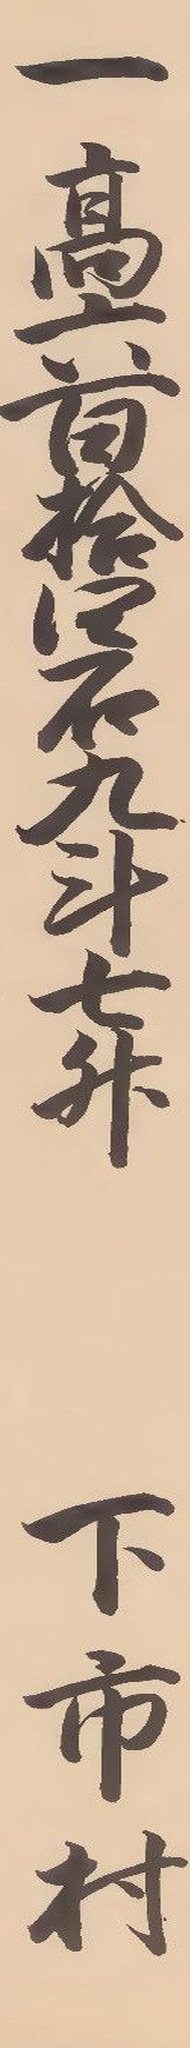一髙六百拾四石九斗七升下市村
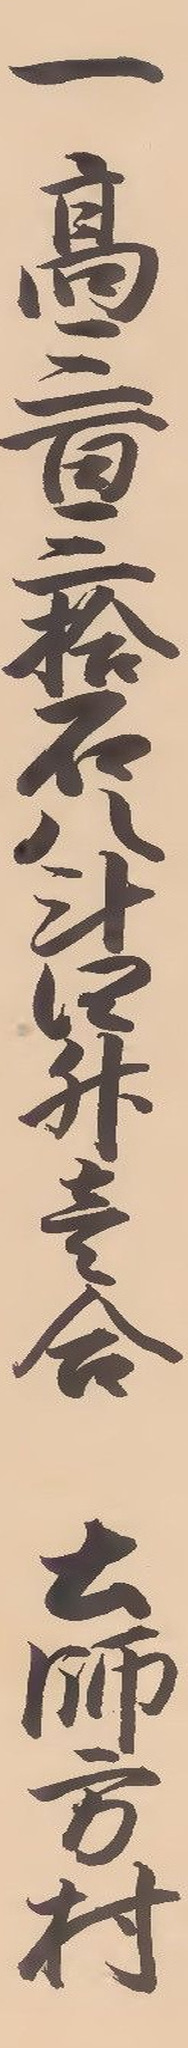一髙三百三拾石八斗四升壱合土師方村
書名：備前国郷帳
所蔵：国立公文書館 National Archives of Japan
